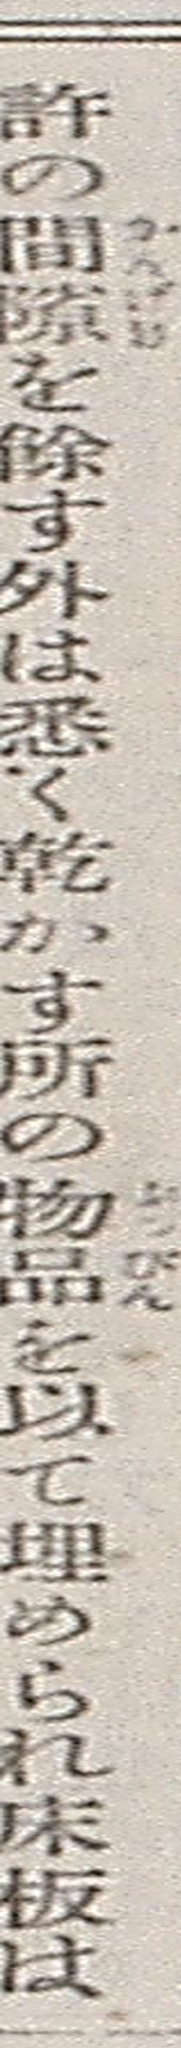許の間隙をを餘す外は悉く乾かす所の物品を以て埋められ床板は
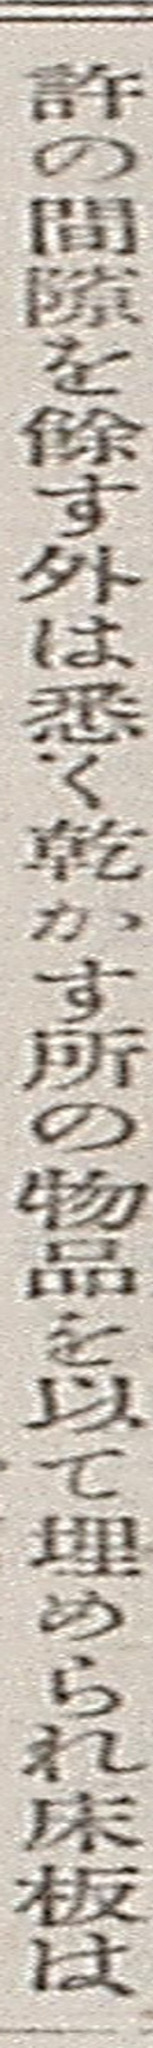許の間隙をを餘す外は悉く乾かす所の物品を以て埋められ床板は
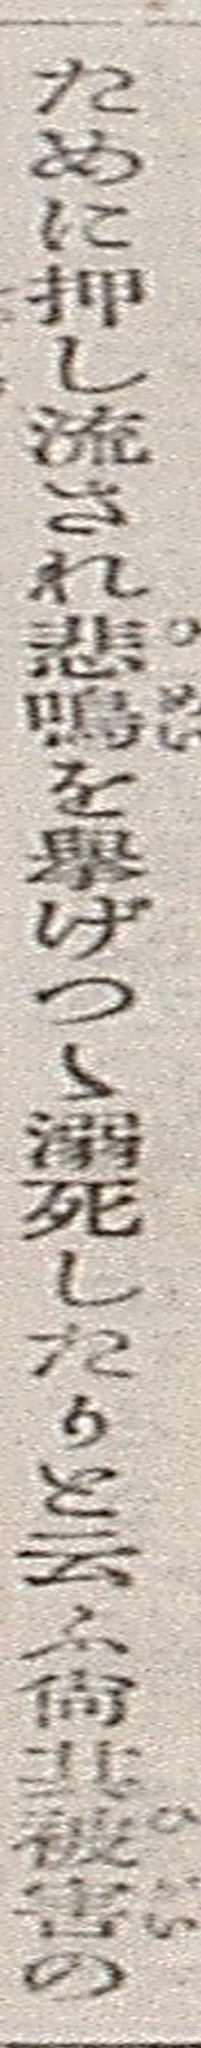ために押し流され悲鳴を挙げつゝ溺死したりと云ふ尚其被害の
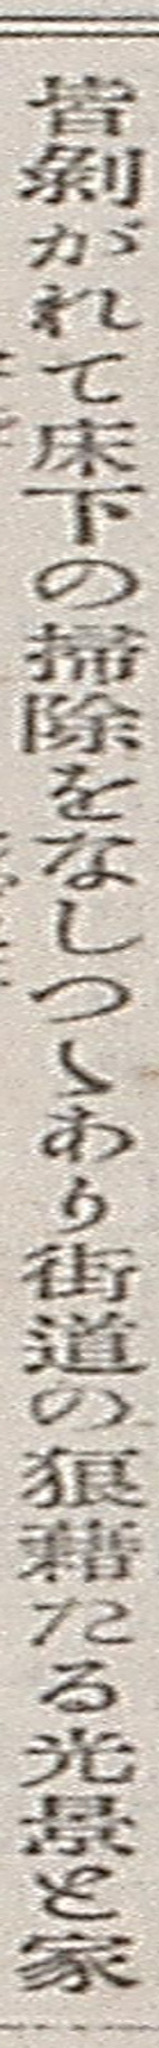皆剥がれて床下の掃除をなしつゝあり街道の狼藉たる光景と家
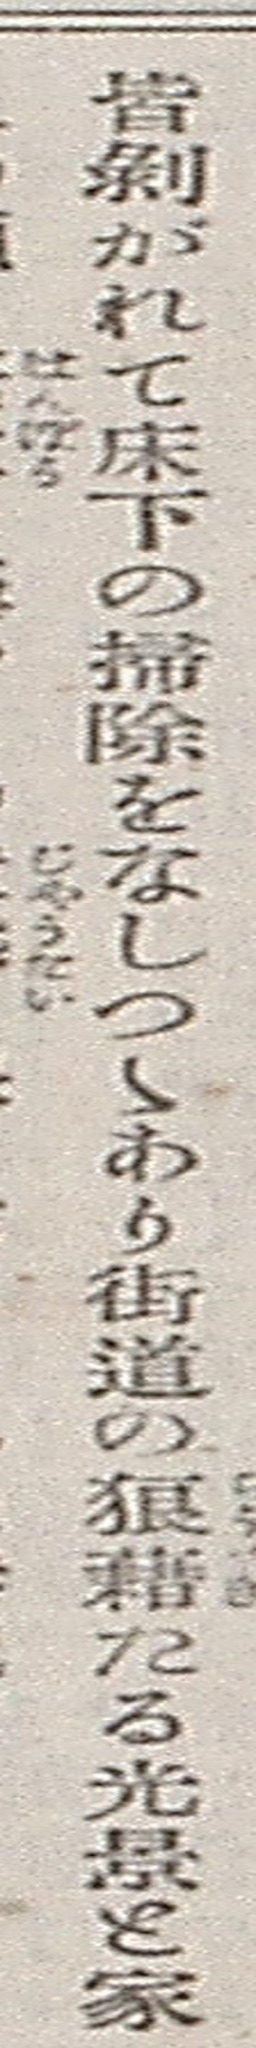皆剥がれて床下の掃除をなしつゝあり街道の狼藉たる光景と家
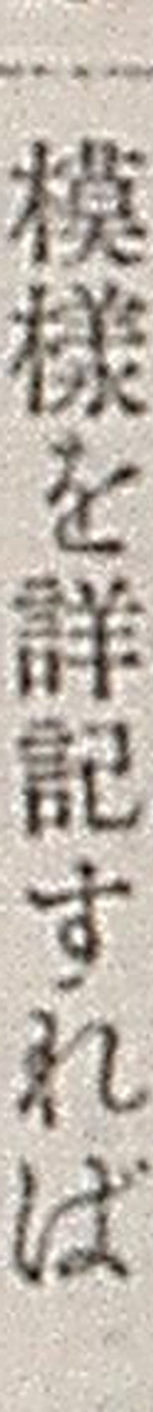模様を詳記すれば
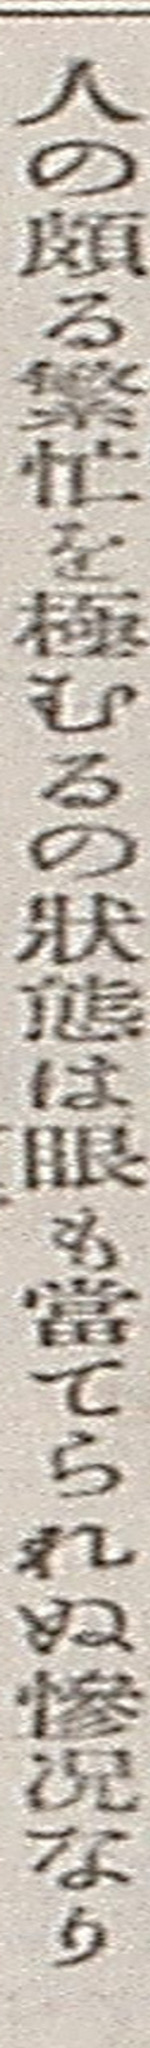人の頗る繁忙を極むるの状態は眼も当られぬ惨況なり
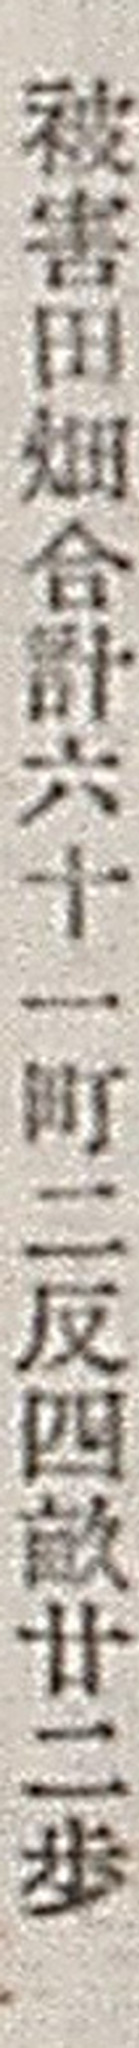被害田畑合計六十一町二反四畝廿二歩
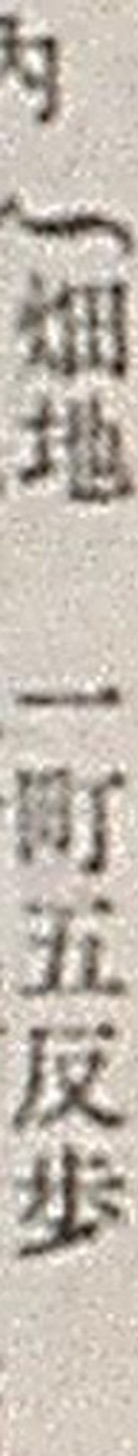内畑地一町五反歩
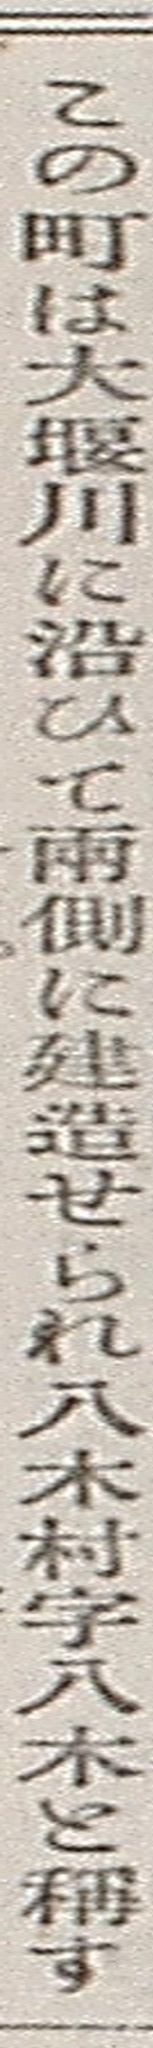この町は大堰川に沿ひて両側に建造せられ八木村字八木と称す
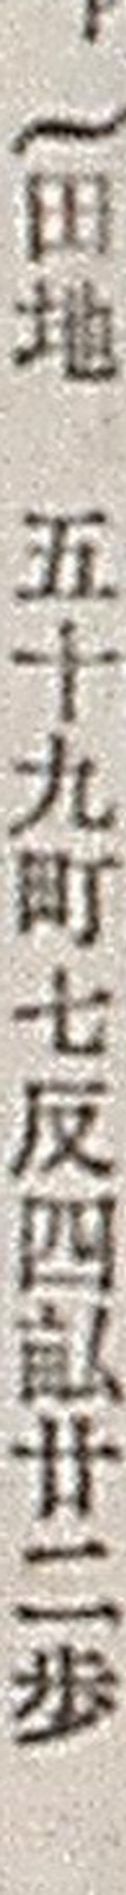田地五十九町七反四畝廿二歩
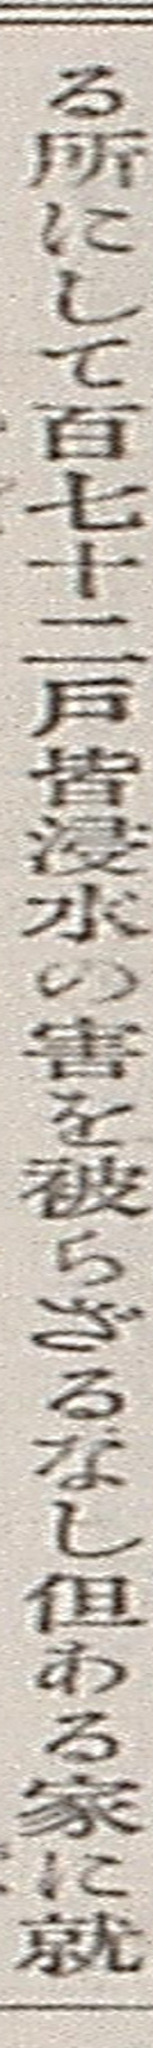る所にして百七十二戸皆浸水の害を被らざるなし但ある家に就
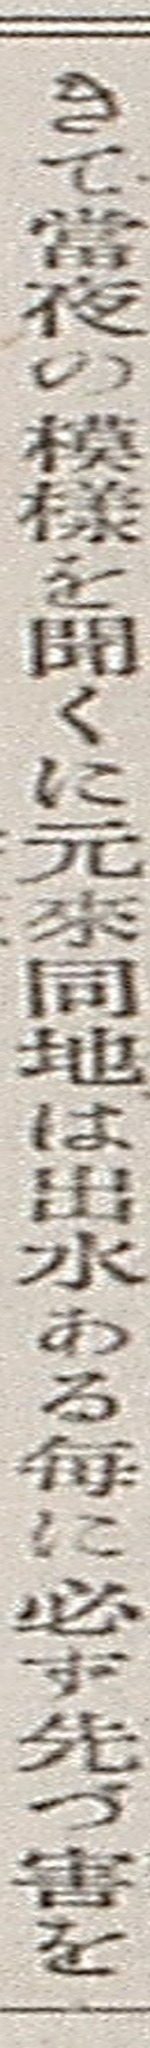きて当夜の模様を聞くに元来同地は出水ある毎に必ず先ず害を
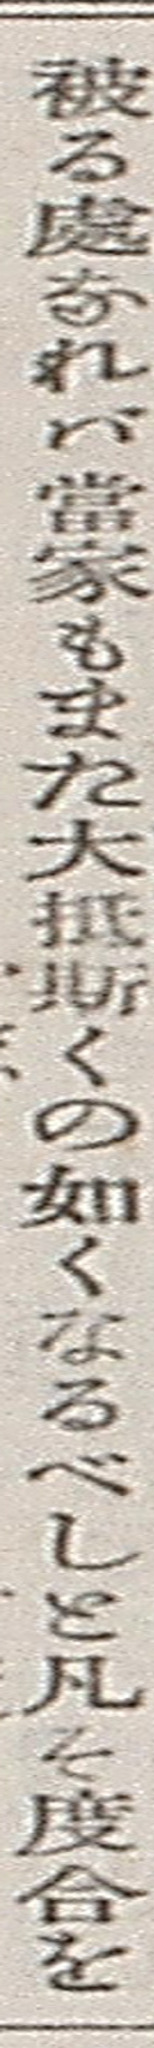被る処なれば当家もまた大抵斯くの如くなるべしと凡そ度合を
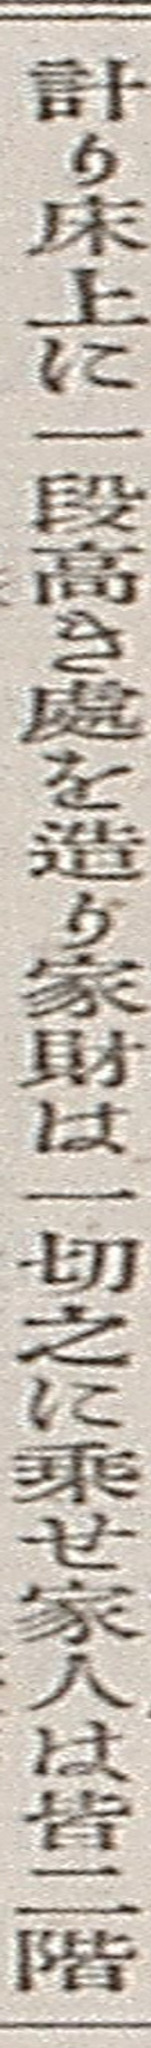計り床上に一段高き処を造り家財は一切之に乗せ家人は皆二階
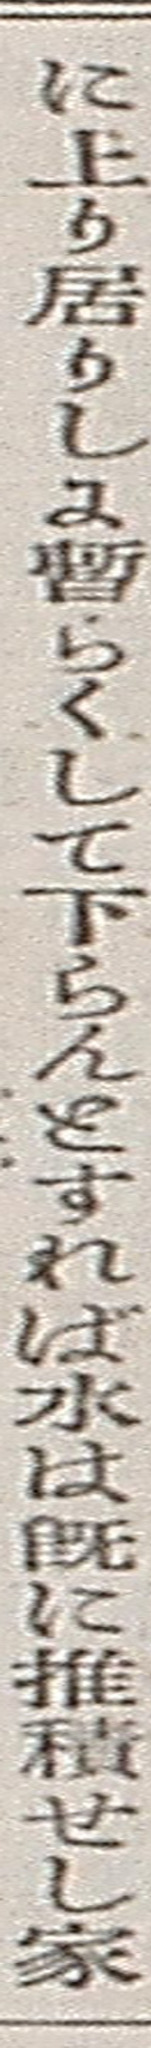に上り居りしに暫らくして下らんとすれば水は既に堆積せし家
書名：風俗畫報臨時増刊第百二十六號　洪水被害録（中）
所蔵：東京大学地震研究所図書室 Earthquake Research Institute Library, The University of Tokyo, JAPAN
